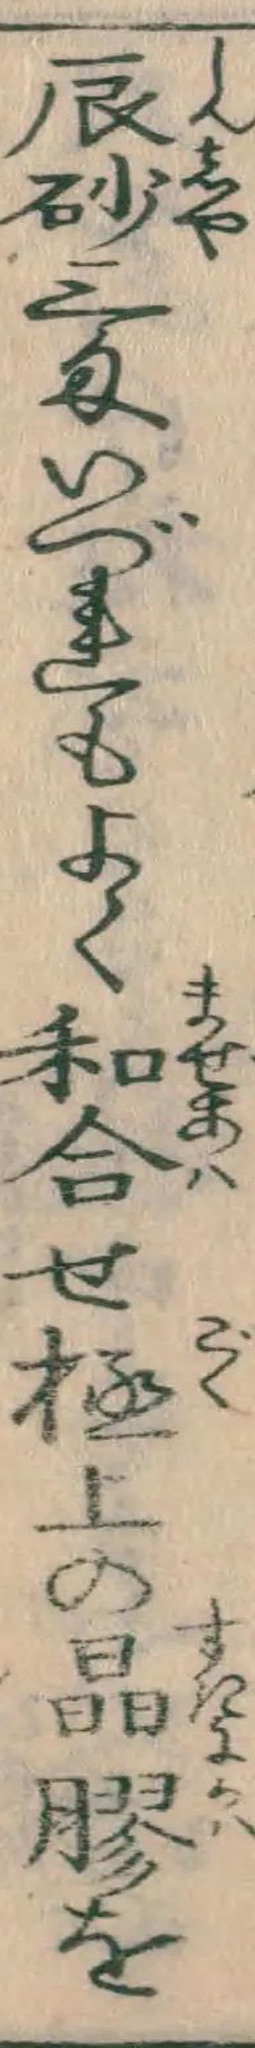辰砂三匁いづれもよく和合せ極上の晶膠を
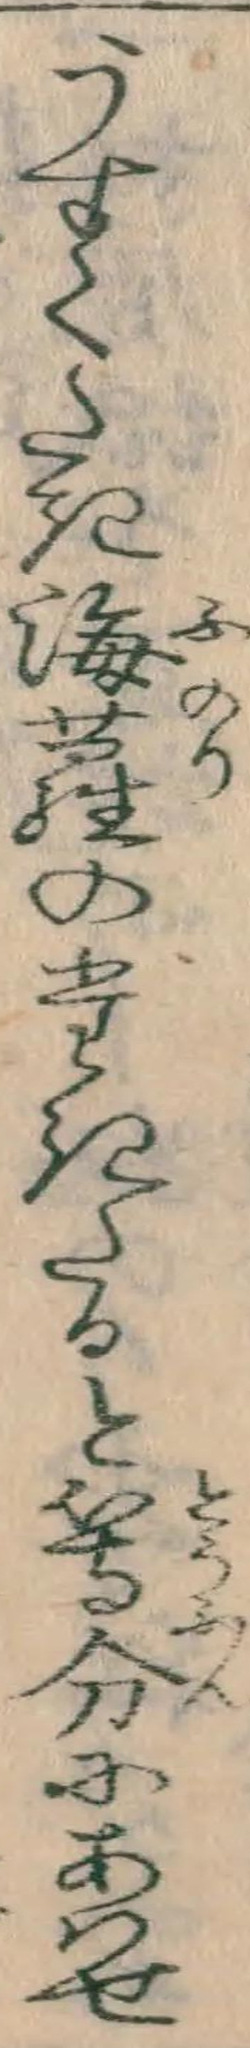うすくたき海蘿のたきたると等分にあはせ
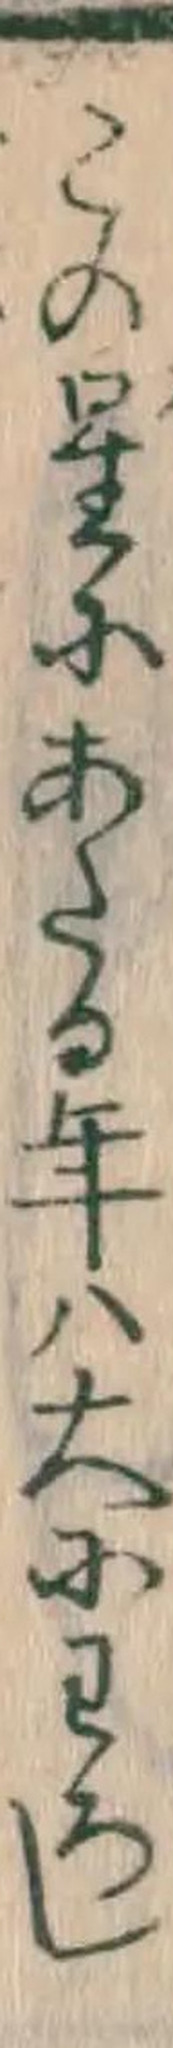この星にあたる年は大にわろし
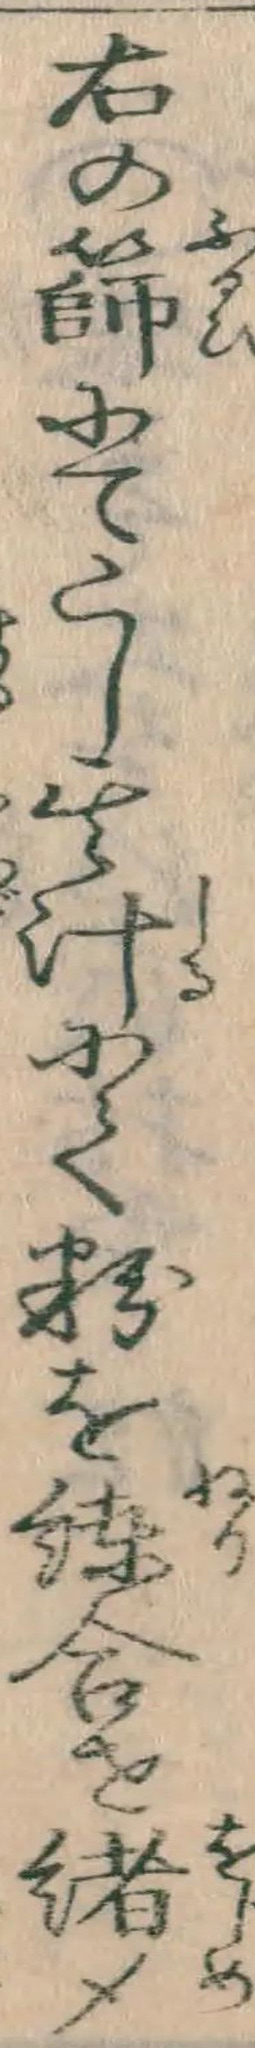右の篩にてこし其汁にて粉を練合せ緒〆
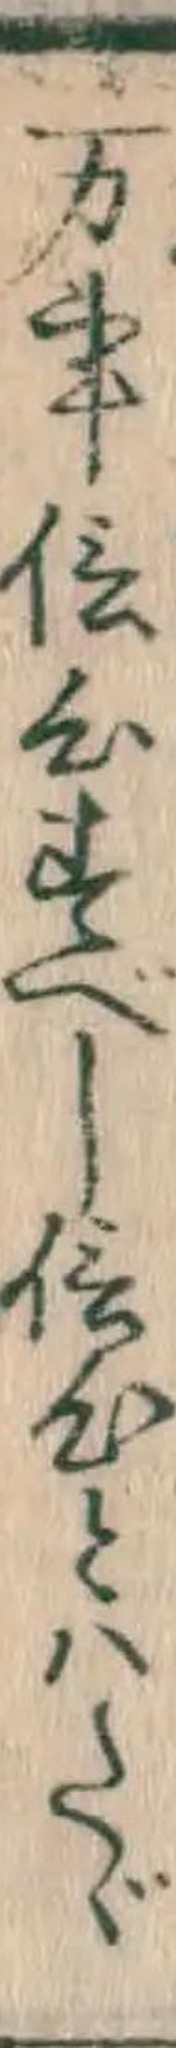万事信心すべし信心とはたゞ
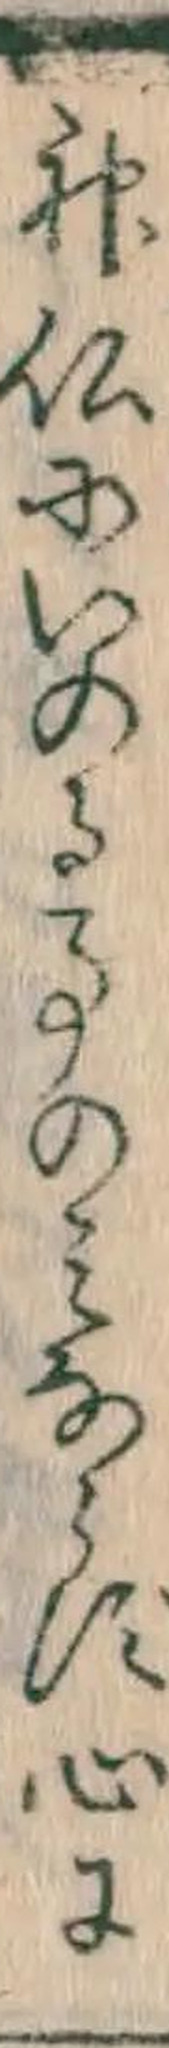神仏にいのる事のみならず心に
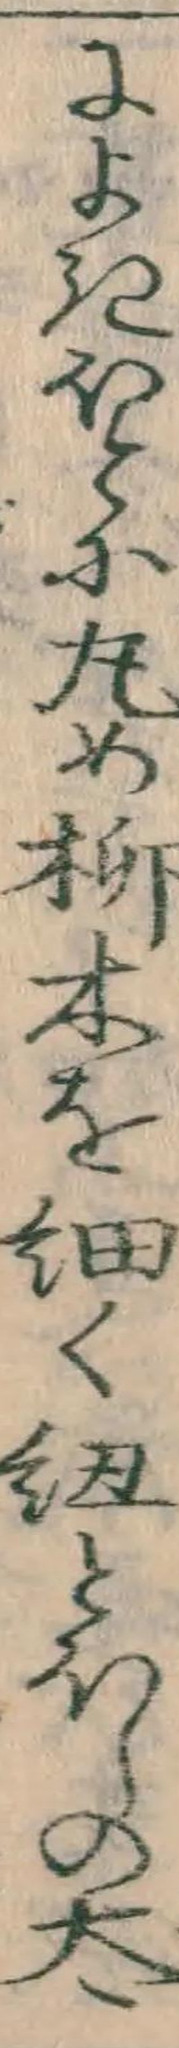によきほとに丸め柳木を細く紐とほしの太
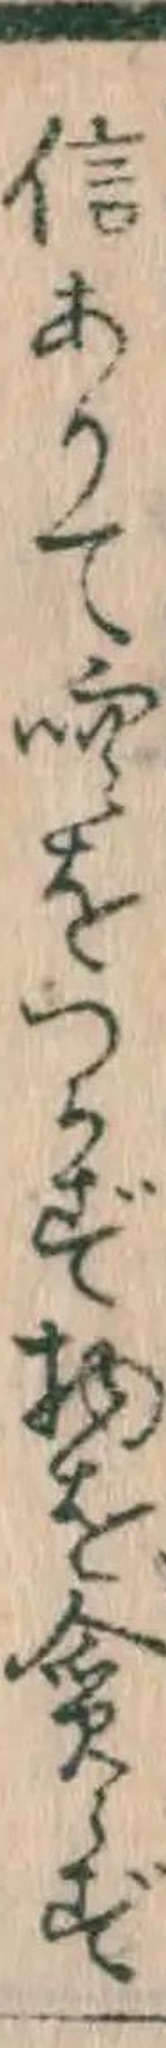信ありて嘘をつかず物を貪らず
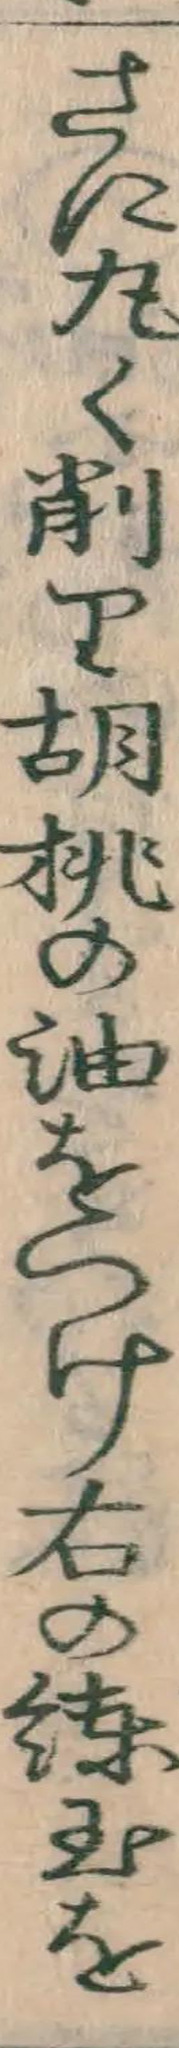さに丸く削り胡桃の油をつけ右の練玉を
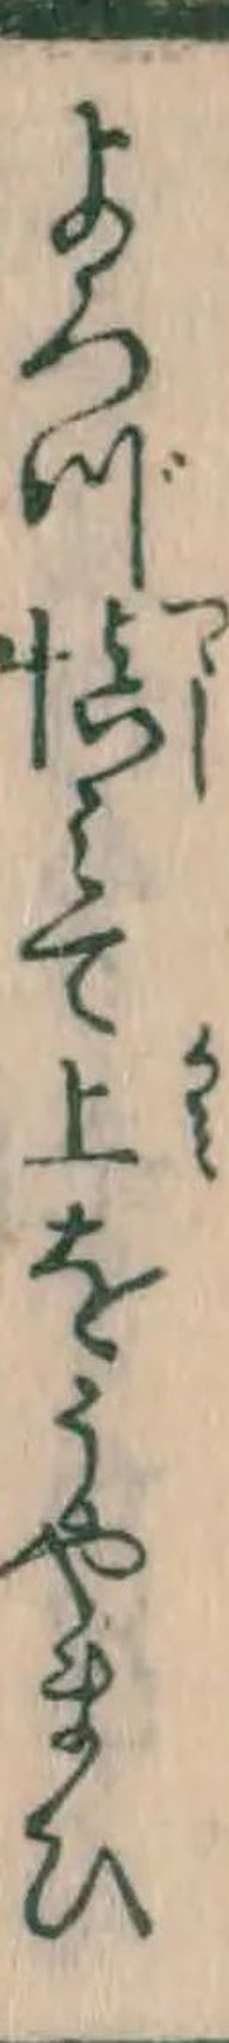よろづ慎みて上をうやまひ
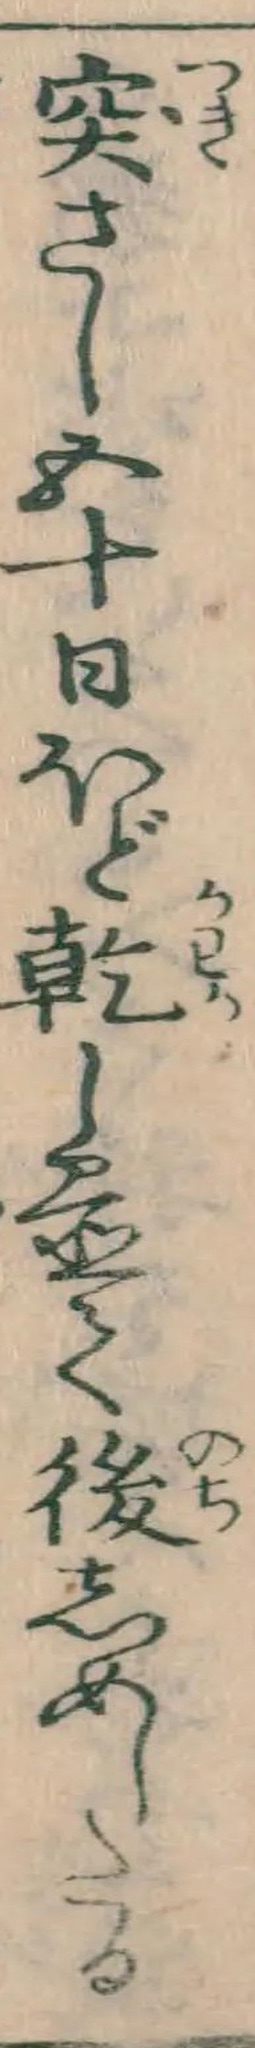突さし五十日ほど乾し置て後しめしたる
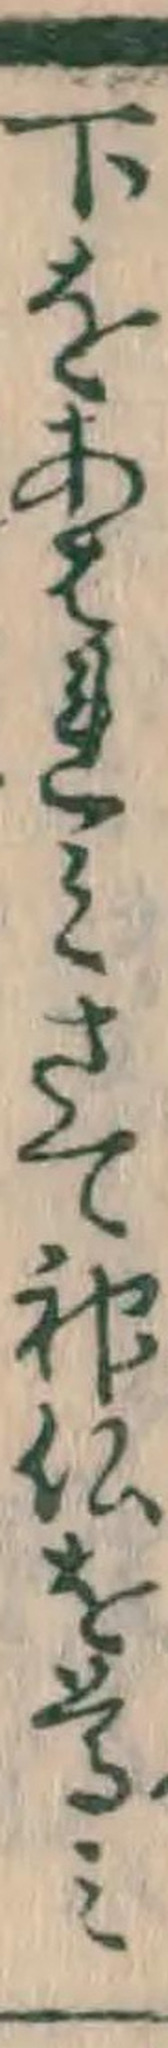下をあはれみさて神仏を尊み
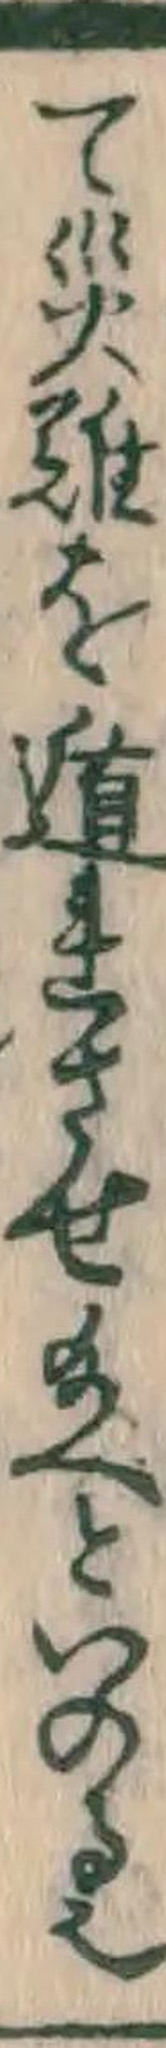て災難を遁れさせ給へといのる也
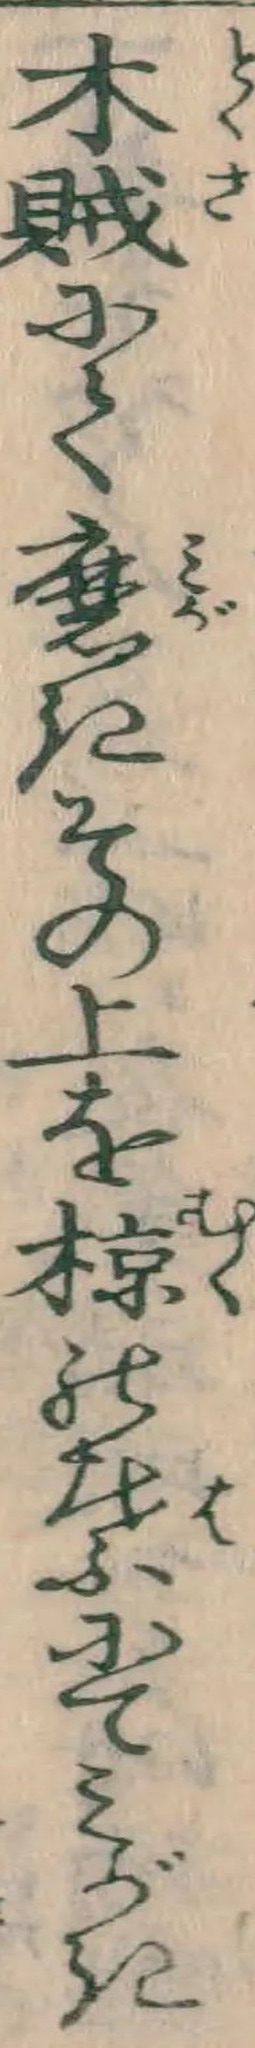木賊にて磨きその上を椋の葉にてみがき
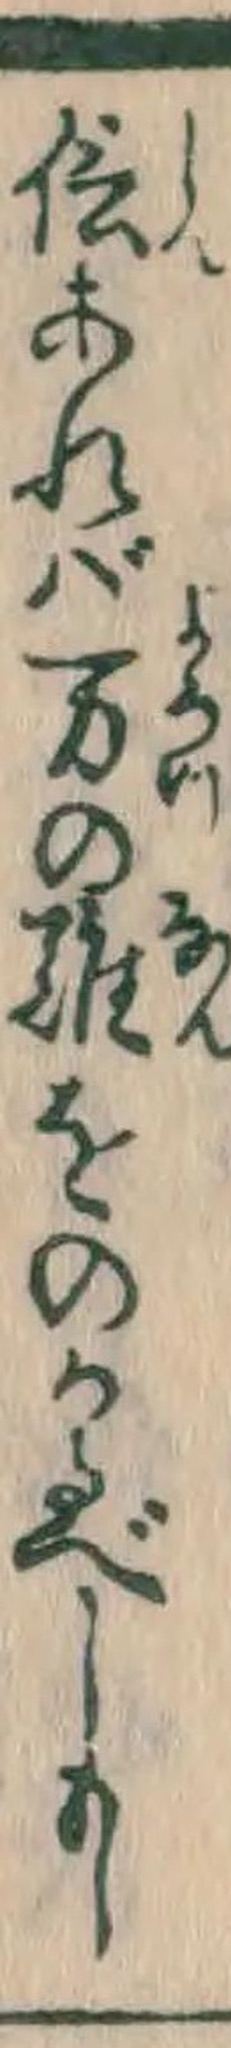信あれば万の難をのかるべしもし
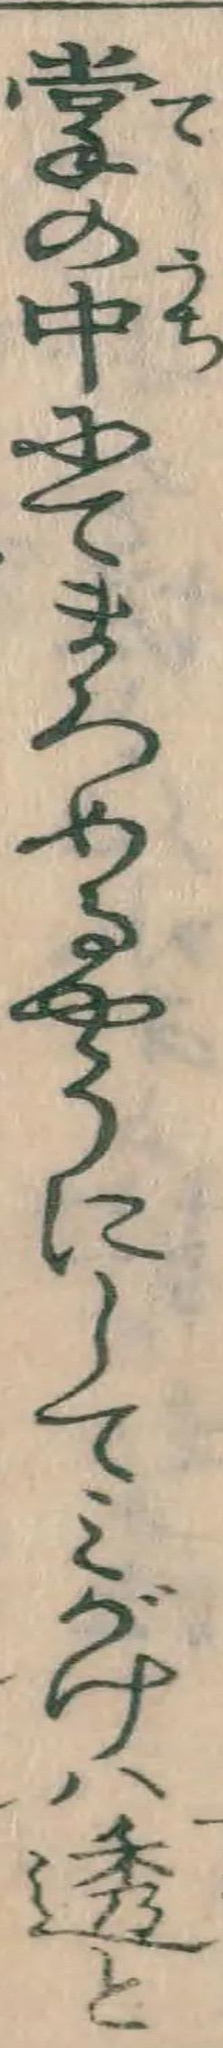掌の中にてまろめるやうにしてみがけは透と
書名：広益秘事大全 3巻. [1]
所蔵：国立国会図書館 National Diet Library, JAPAN
